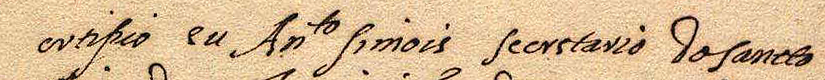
Certifico eu Anto simois secretario do sancto
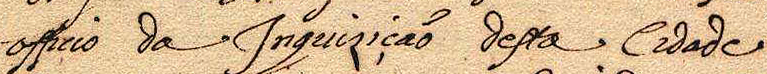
officio da Jnquizição desta Cidade
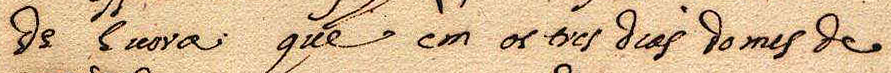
de Euora que em os tres dias do mes de
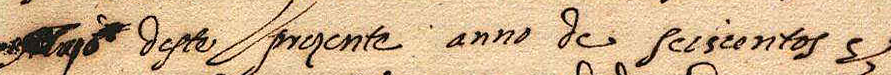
Majo deste prezente anno de seiscentos E
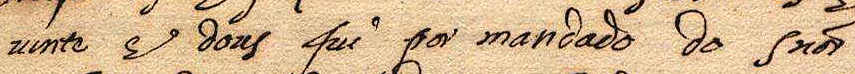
uinte E dous fui por mandado do snōr
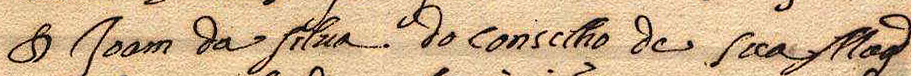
D Joam da Silua do conselho de sua Magde
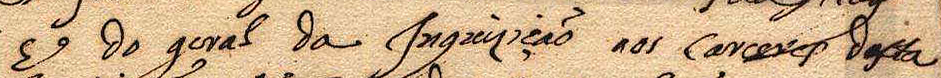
E do geral da Jnquizição aos Carceres desta
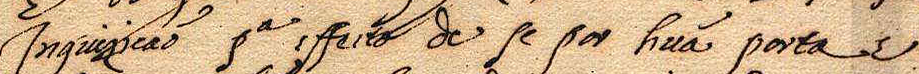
Jnquizição pa effeito de se por huā porta E
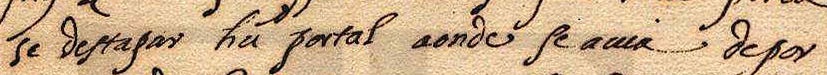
se destapar hū portal aonde se auia de por
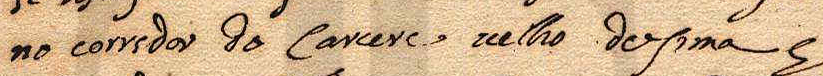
no corredor do Carcere uelho de sima E
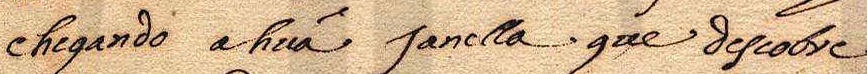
chegando a huā Janella que descobre
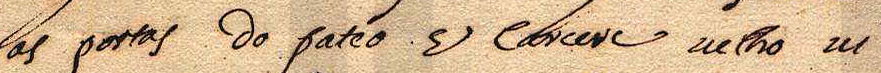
as portas do pateo E Carcere uelho ui
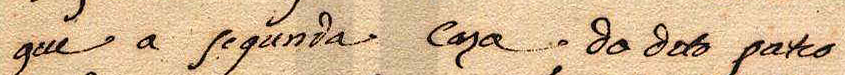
que a segunda caza do dito pateo
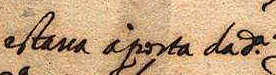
estaua a porta da d.a
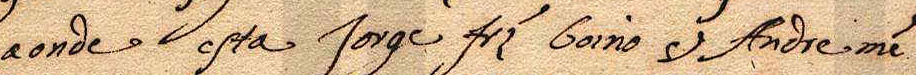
aonde esta Jorge frz̄ Goino E Andre mē
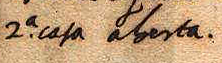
2.a casa aberta.
